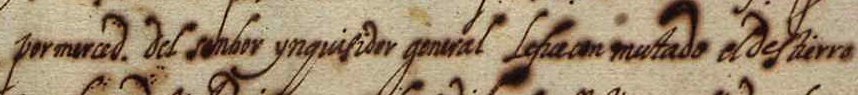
por merced. del senhor ynquisidor general le fue conmutado el destierro
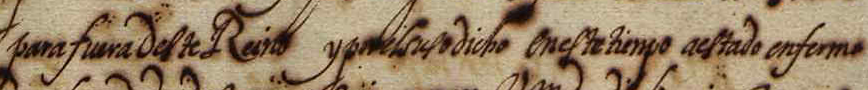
para fuera deste Reino, y por el susodicho en este tienpo a estado enfermo
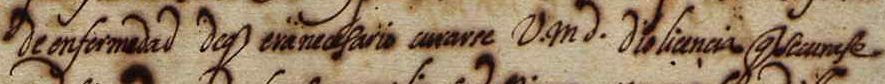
de enfermedad de q̄ era necesario curarse V. md. dio licencia q̄ se curase
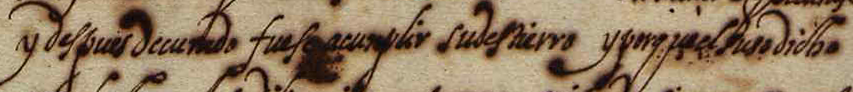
y despues de curado fuese a cunplir su destierro y porque el susodicho
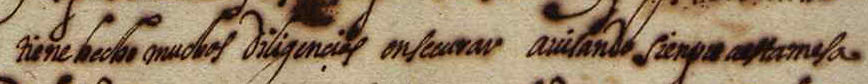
tiene hecho muchas diligencias en se curar auisando sienpre a esta mesa
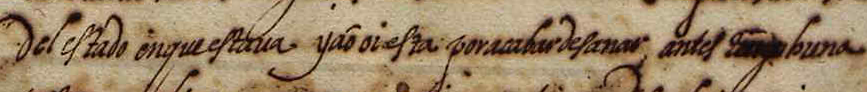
del estado en que estaua y aō oi esta por acabar de sanar, antes tengo huna
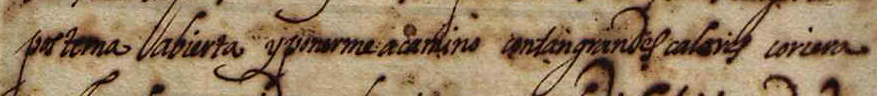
postema abierta y ponerme a camino con tan grandes calores coriera
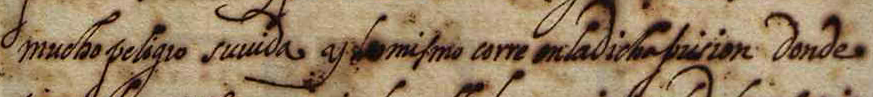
mucho peligro su uida y lo mismo corre en la dicha prision, donde
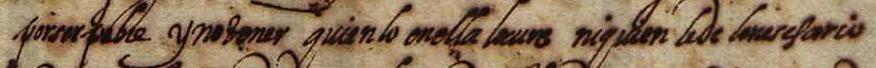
por ser pobre, y no tener quien lo en ella lo cure ni quien le de lo necesario
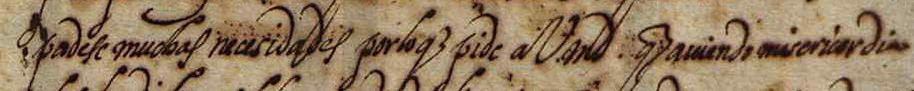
padese muchas necesidades por lo q̄ pide a V md. q̄ auiendo misericordia
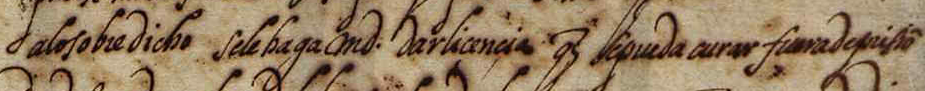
a lo sobredicho se le haga md. dar licencia q̄ se pueda curar fuera de prisiō
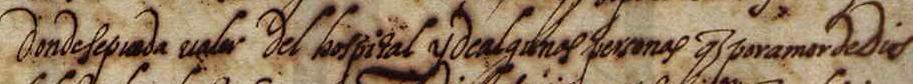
donde se pueda ualer del hospital y de algunas personas q̄ por amor de Dios
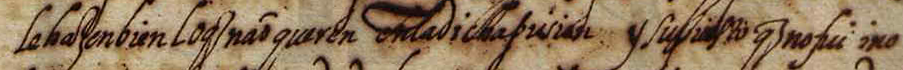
le hazen bien lo q̄ naõ queren en la dicha pririon y supuesto q̄ no fui ino
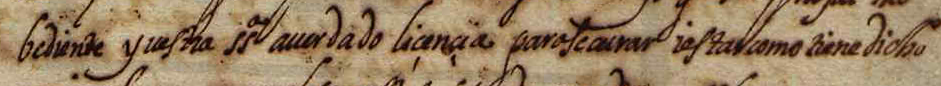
bediente y uestra ssa auer dado licencia para se curar i estar como tiene dicho
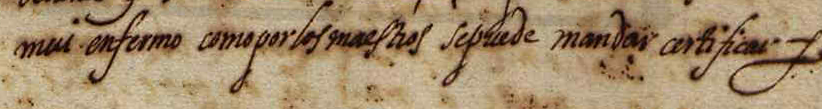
mui enfermo como por los maestro se puede mandar certificar
